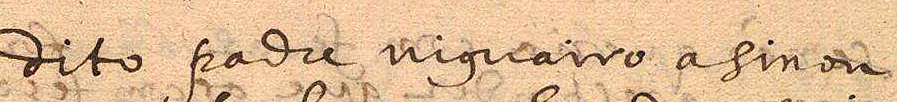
dito padre uiguairo asinou
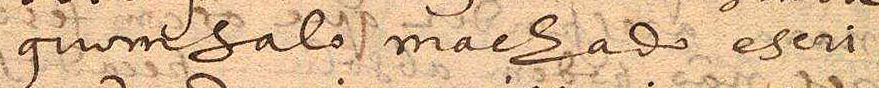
guomsalo machado escri
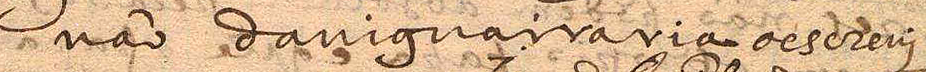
uaõ dauiguairaria o escreuj
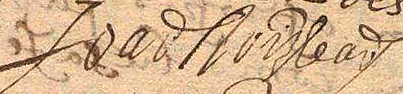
Joaõ Roīs leaõ
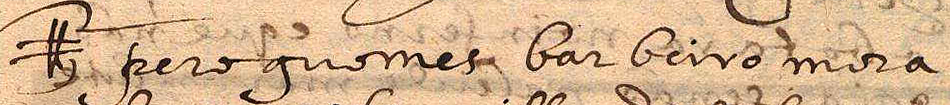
item pero guomes barbeiro mora
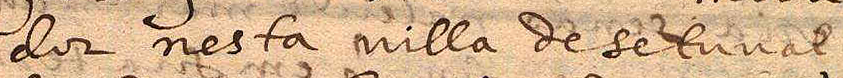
dor nesta uilla de setuual
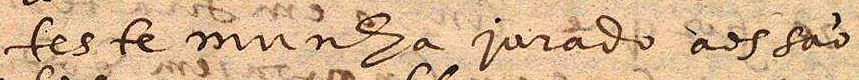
testemunha jurado aos saõ
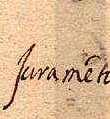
Juramēto
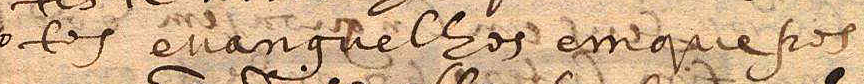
tos euanguelhos em que pos
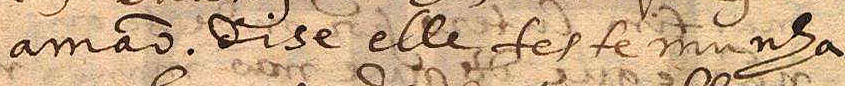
a mão. dise elle testemunha
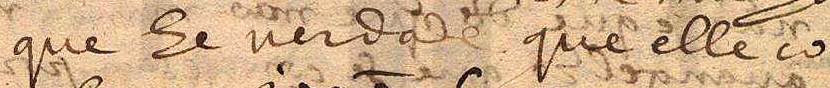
que he uerdade que elle co
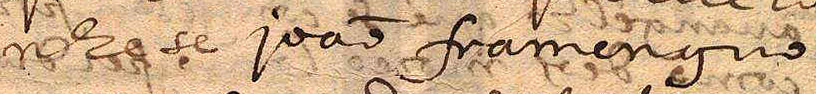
nhese Joaõ framenguo
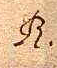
R.
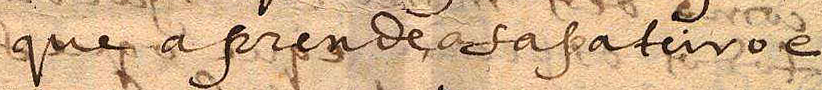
que aprende a sapateiro e
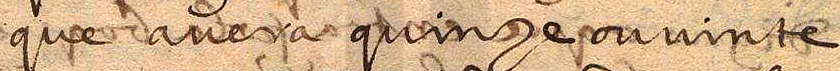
que auera quinze ou uinte
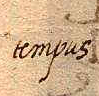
tempus
